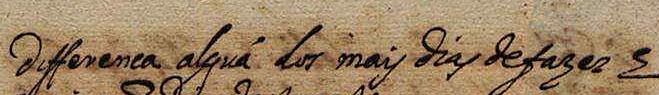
differença alguā dos mais dias de fazer E
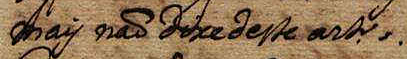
mais naõ dixe deste art.o
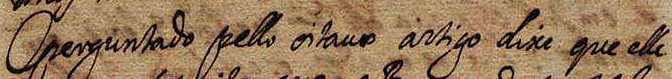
E perguntado pello oitauo artigo disse que elle
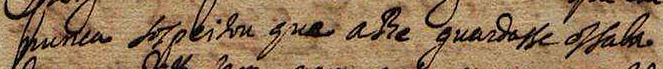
nunca sospeitou que a Re guardasse os saba
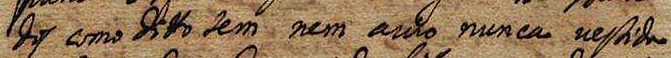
dos como ditto tem nem a uio nunca uestida
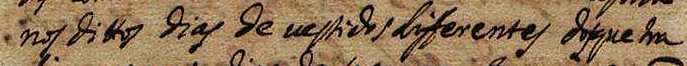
nos dittos dias de uestidos differentes do que tra
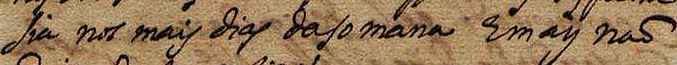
sia nos mais dias da somana E mais naõ
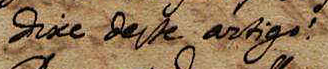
dixe deste artigo?
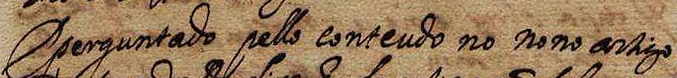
E perguntado pello conteudo no nono artigo
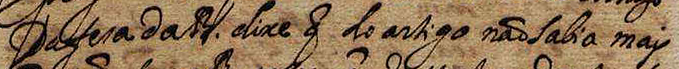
Dafeza da R. dixe q̄ do artigo naõ sabia mais
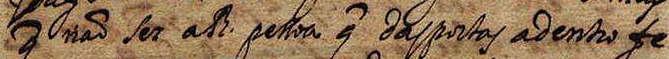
q̄ não ser a R. pessoa q̄ das portas adentro fe
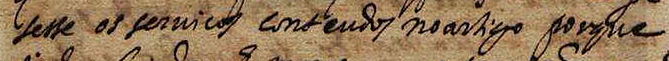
sesse os seruiços conteudos no artigo porque
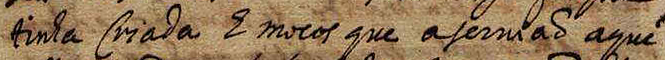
tinha Criada E moços que a seruião a quē
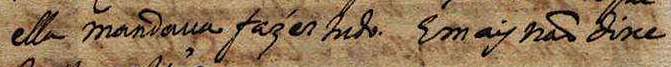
ella mandaua fazer tudo. E mais naõ dixe
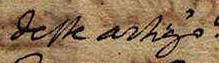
deste artigo.
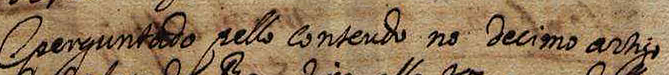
E perguntado pello conteudo no decimo artigo
